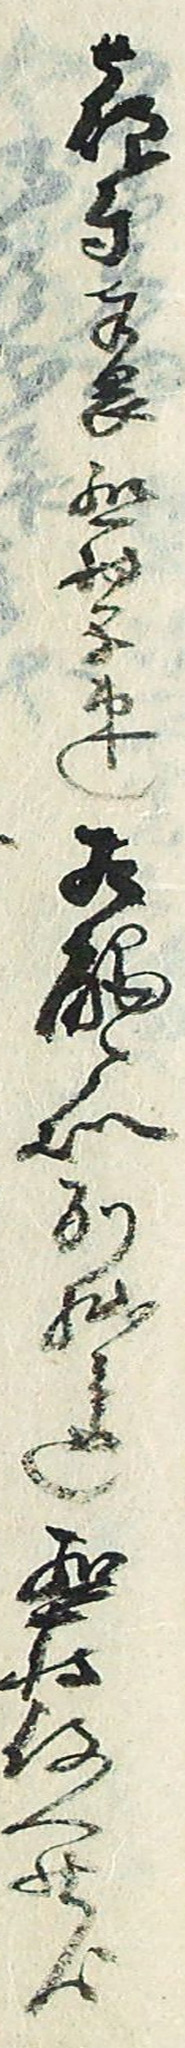被仰付奉畏組村早速相触候処別紙之通組村役人共ゟ
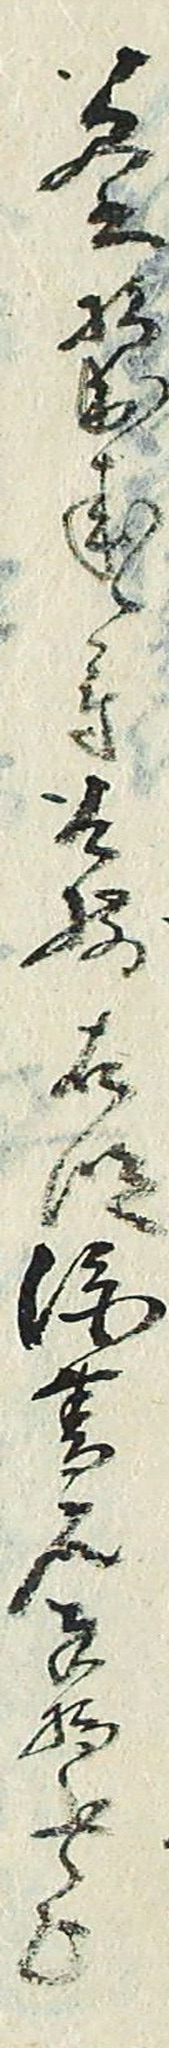御受書指出来候に付取揃右段添書を以奉指上候以上
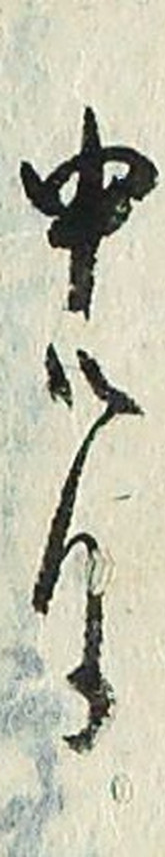申八月
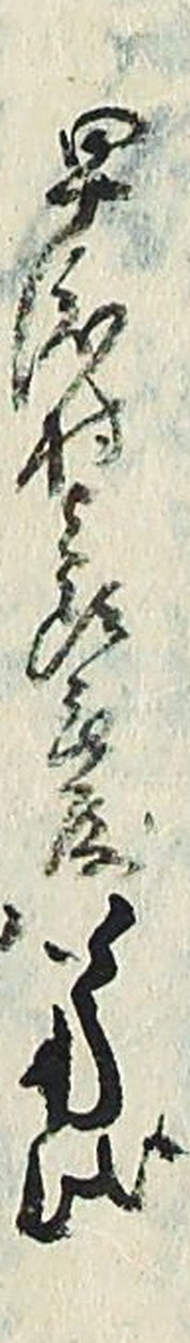早渕村与頭庄屋御用代
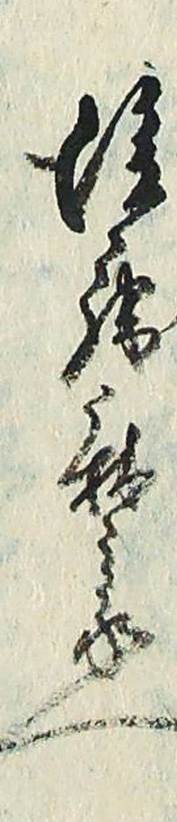後藤麻之丞
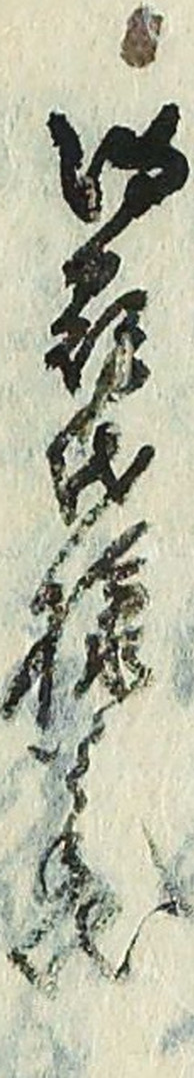御郡代様御手代
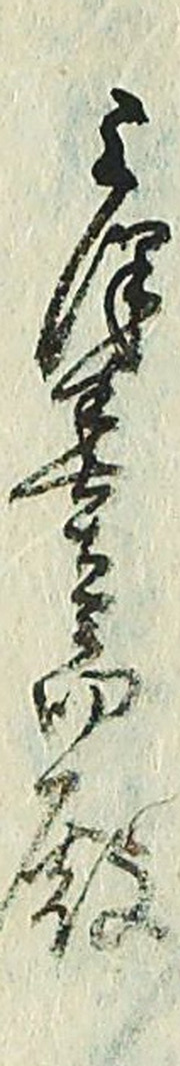三沢春太郎殿
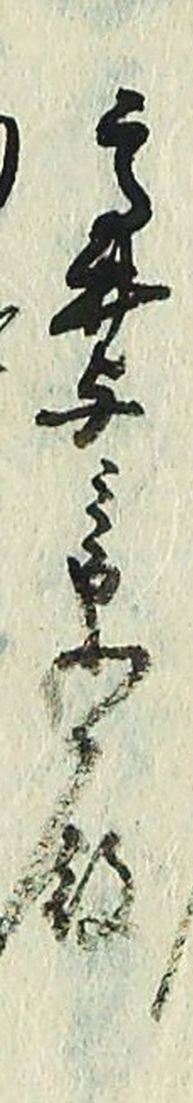高井与三兵衛殿
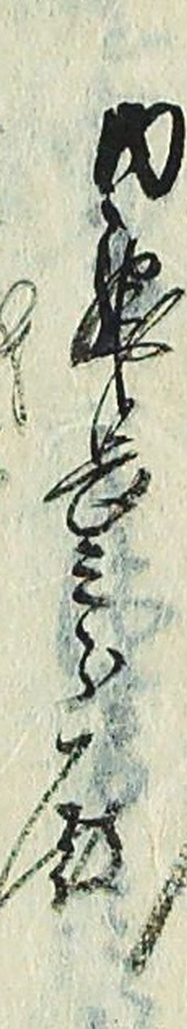内藤長三郎殿
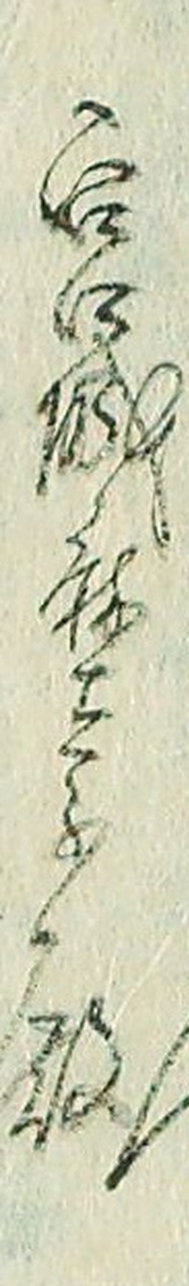宮城麻太郎殿
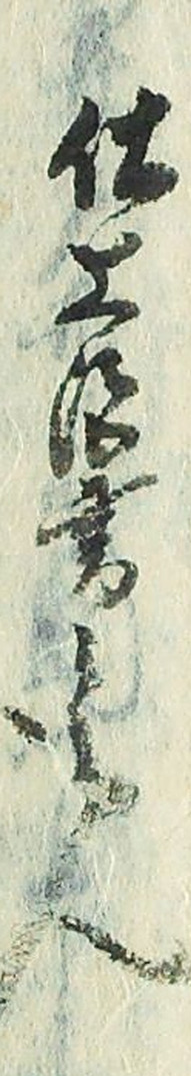仕上添書之覚
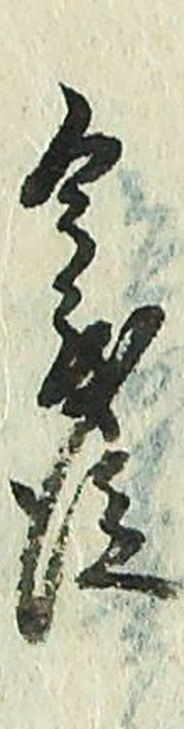今度従
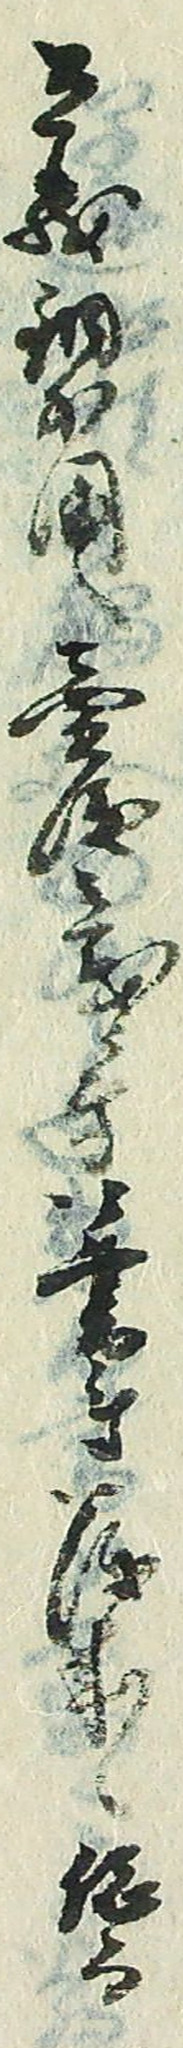公義銅外国へ売渡之義に付御書付御渡成候依而
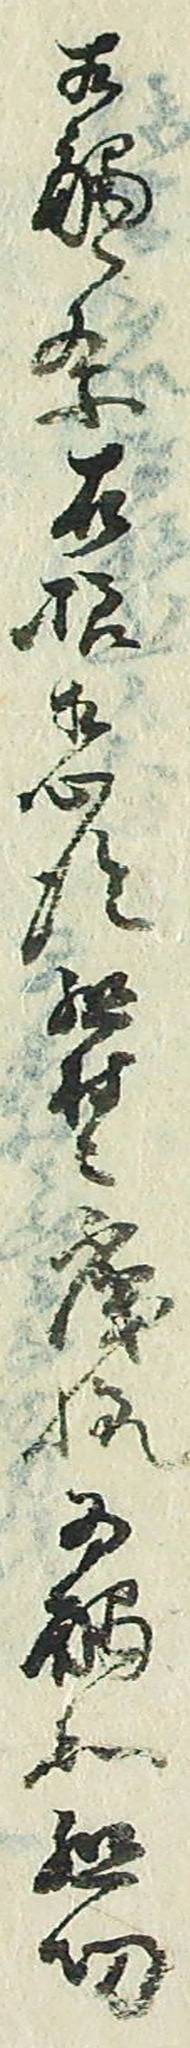相触候条右様相心得組村々不洩様為触知組切
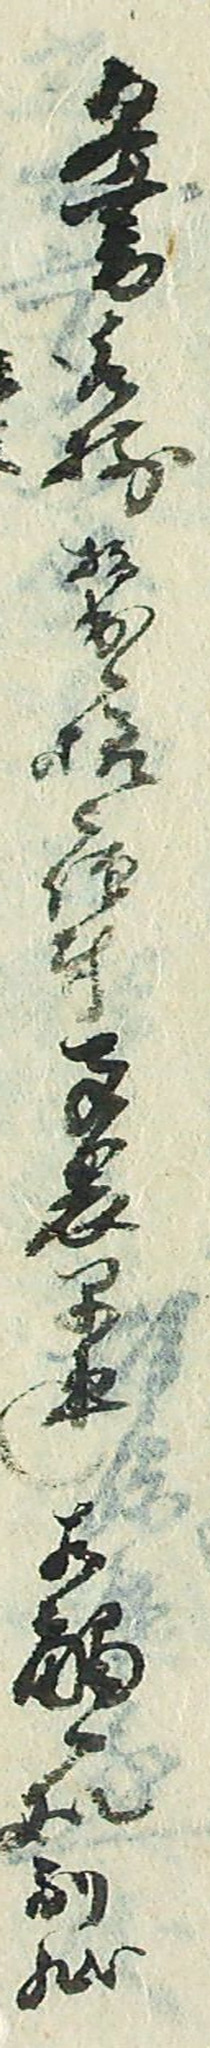受書取揃指出候様被仰付奉畏候早速相触候処別紙
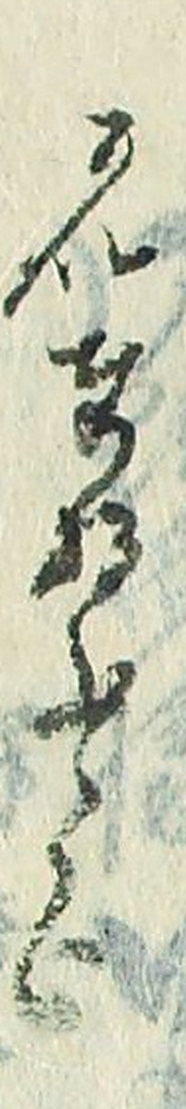を以奉指上以上
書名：諸御用御□受書控
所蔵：鳴門教育大学 Naruto University of Education
